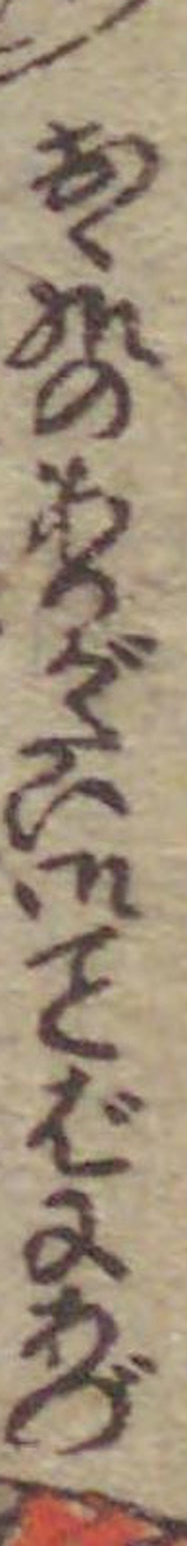おく様のありがたい御ことばにあづ
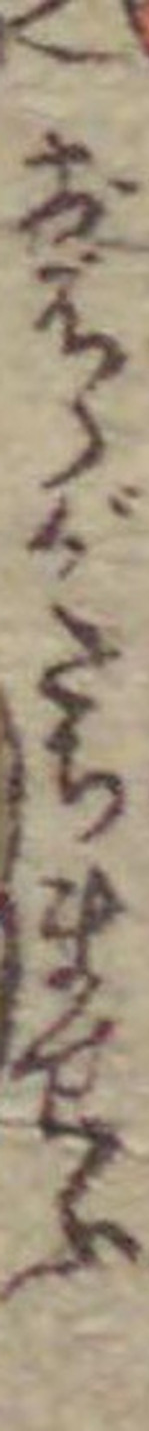おはらがたちませふ
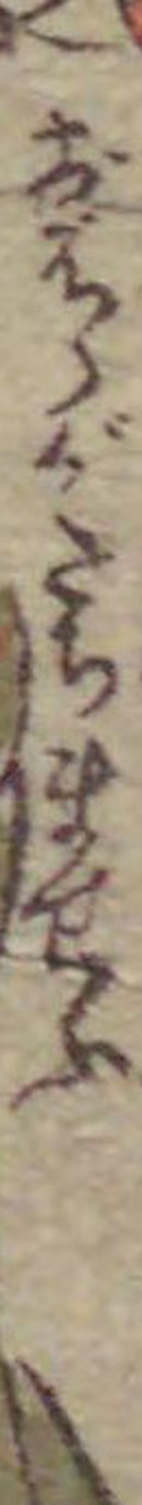おはらがたちませふ
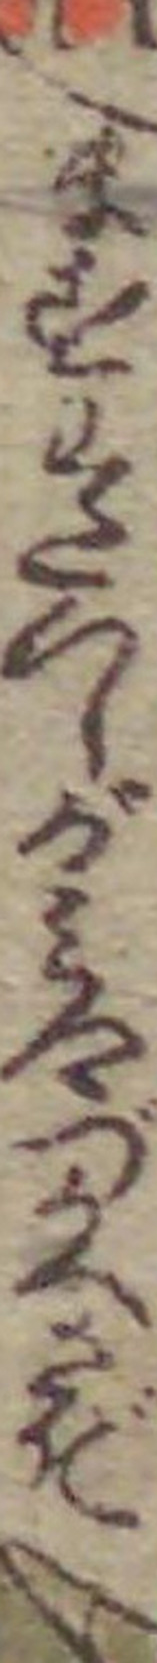ますわたくしがみやづかへさぞ
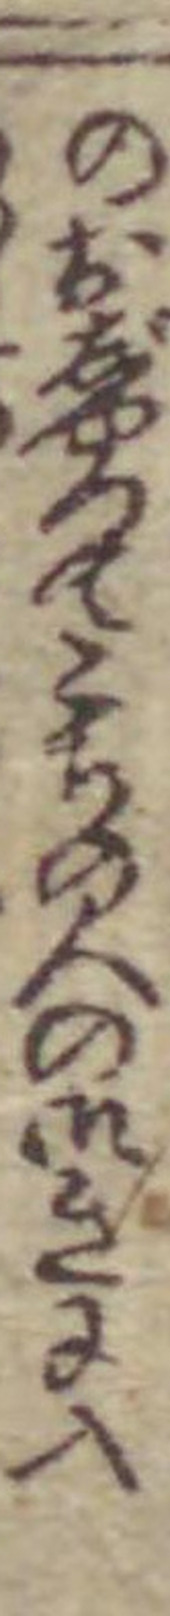のおじゆつてこちの人の御きに入
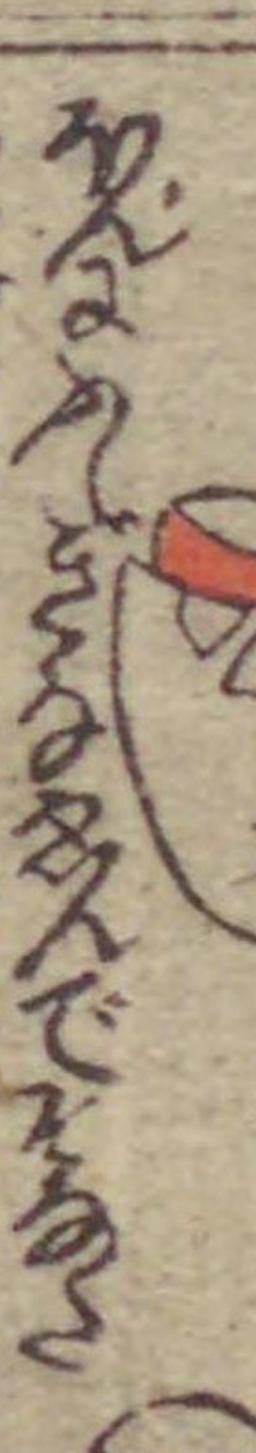ほんにふしぎなゑんでそなた
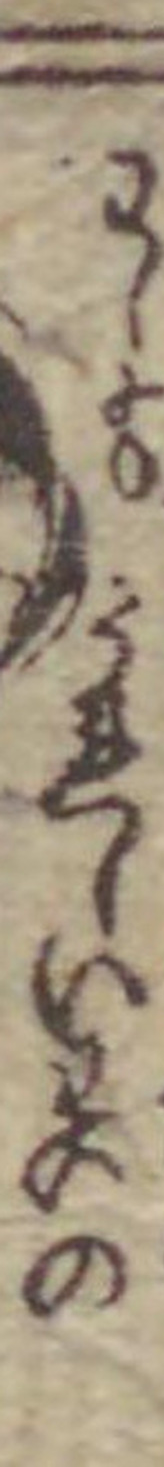わしもうれしいわいの
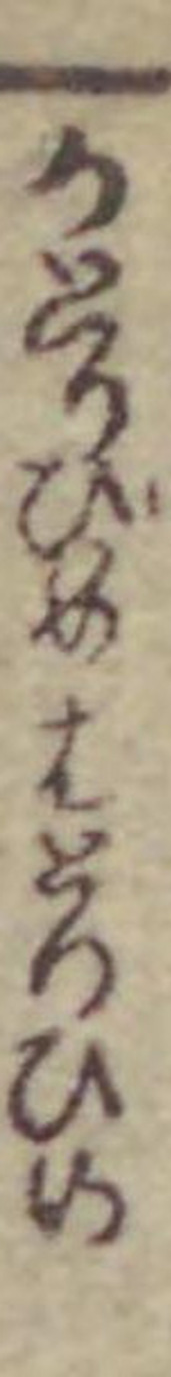かとりひめはとりひめ
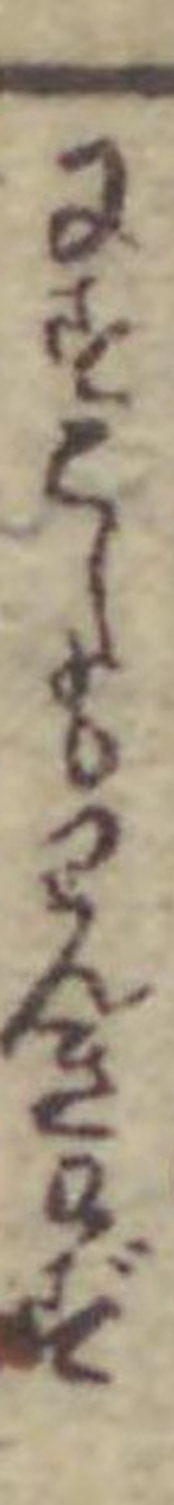にすこしもりんきせず
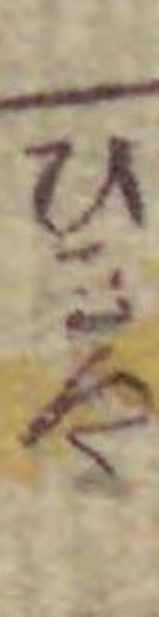ひきや
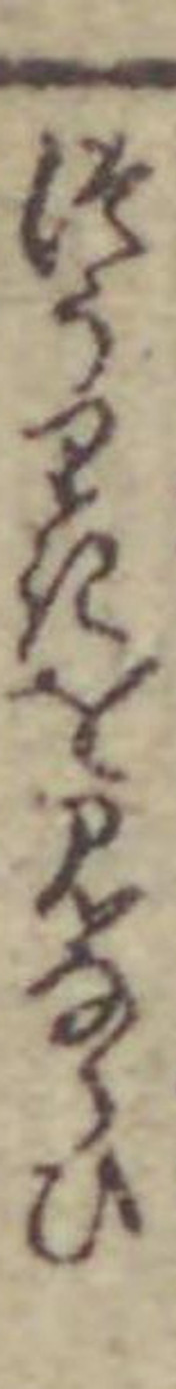つうりきを見ならひ
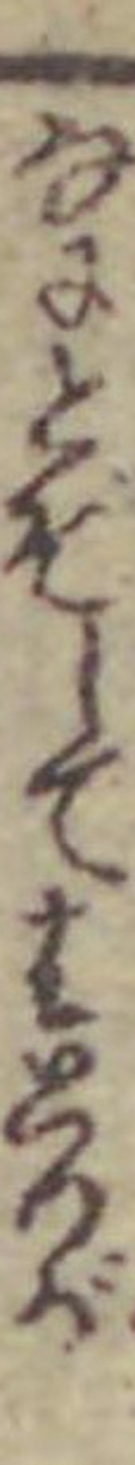なにとぞしてはとりが
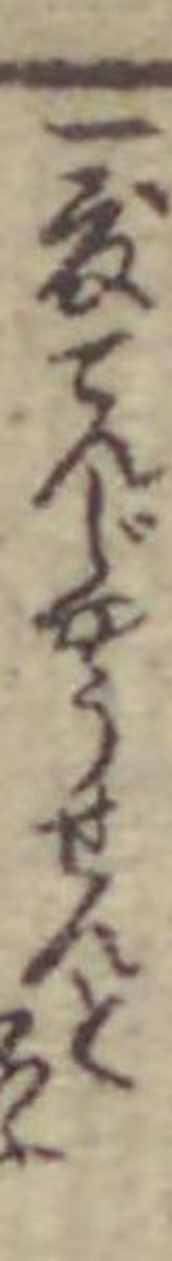一度てんじやうせんと
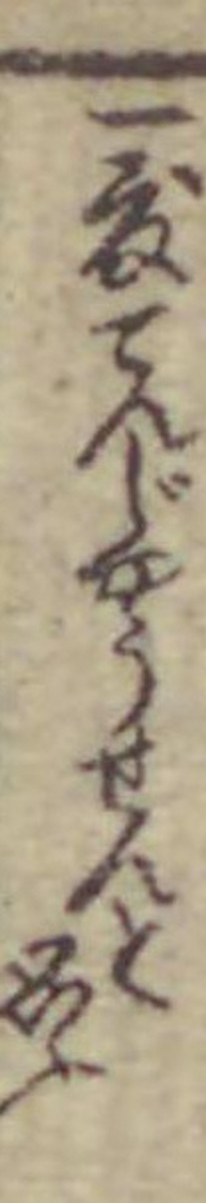一度てんじやうせんと
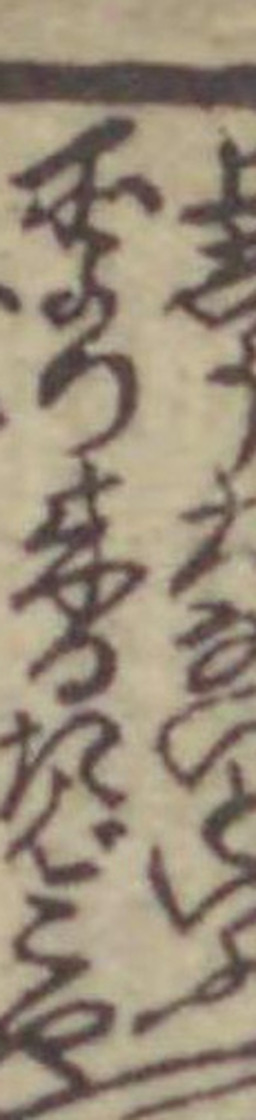所より来るたばこや
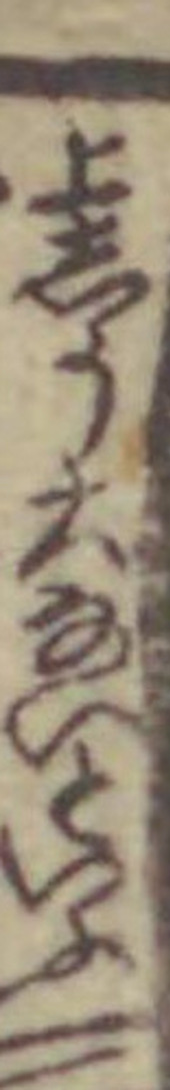上しう大ないといふ
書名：娜二代鉢木 5巻
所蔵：国立国会図書館 National Diet Library, JAPAN
